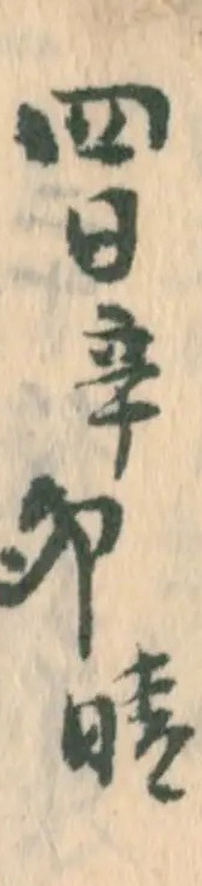四日辛卯晴
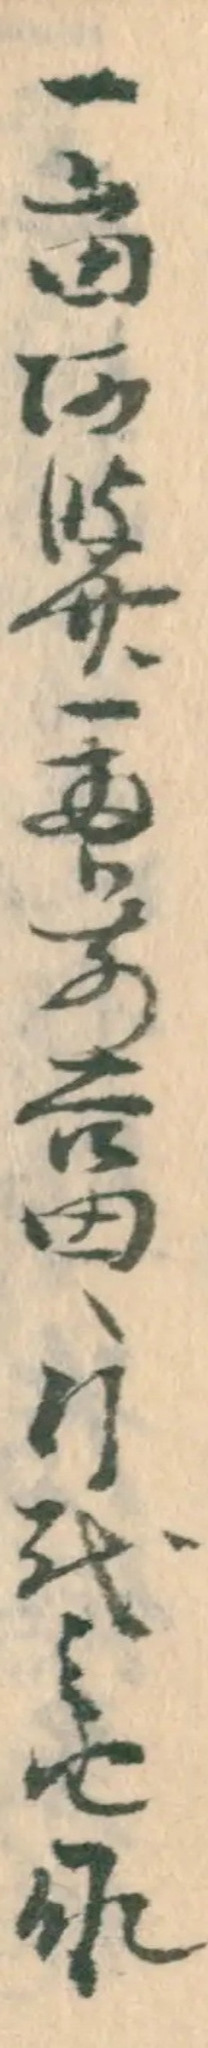一山田阿波介一両日前吉田へ引越之由承
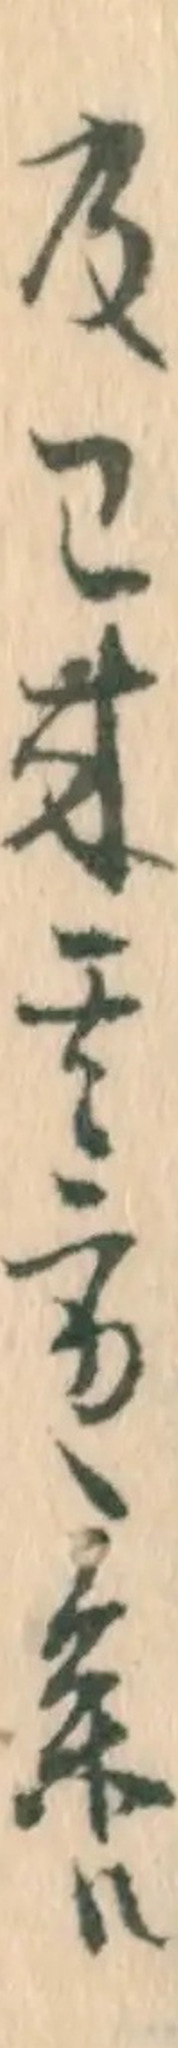及已来其方へ参ル
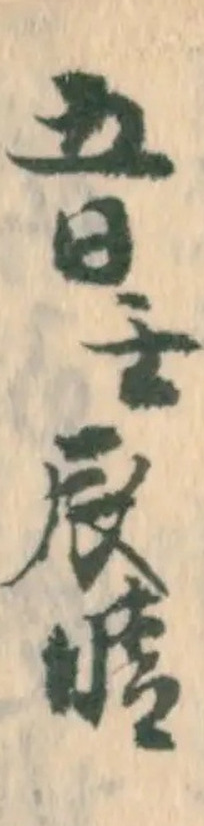五日壬辰晴
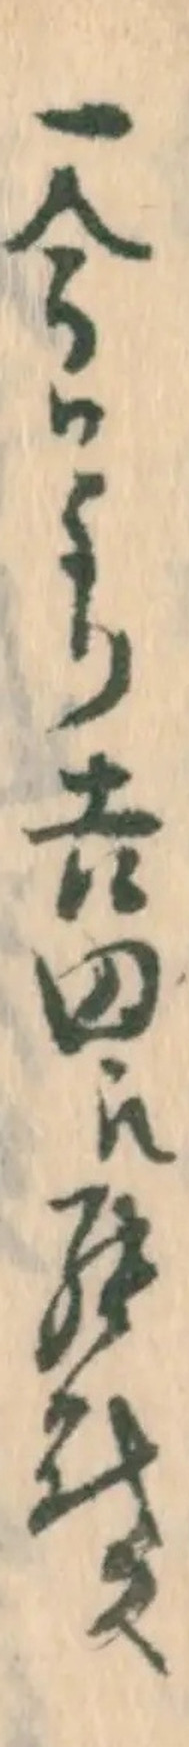一今日より吉田え罷越ス
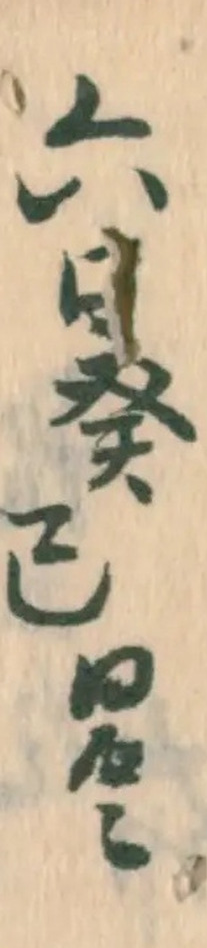六日癸巳曇
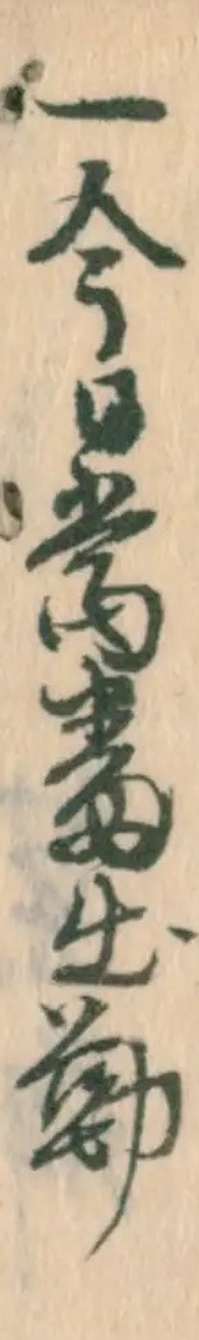一今日当番出勤
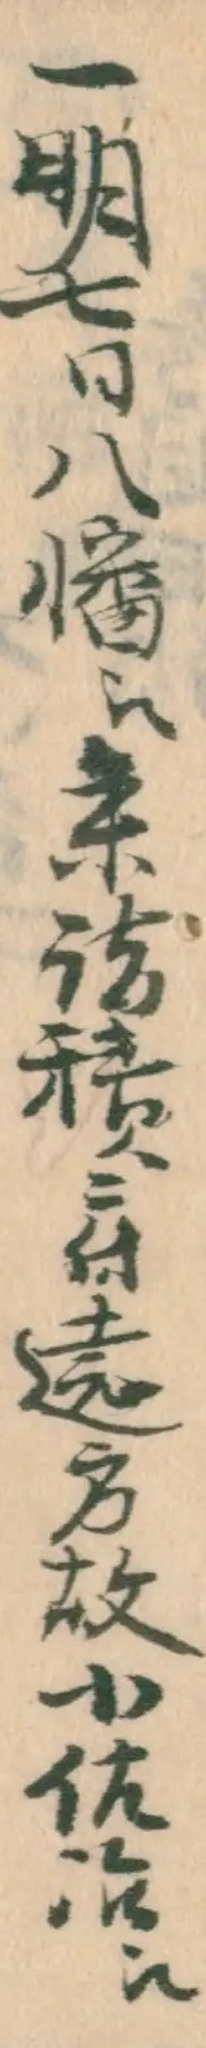一明七日八幡え参詣積ニ付遠方故小佐治え
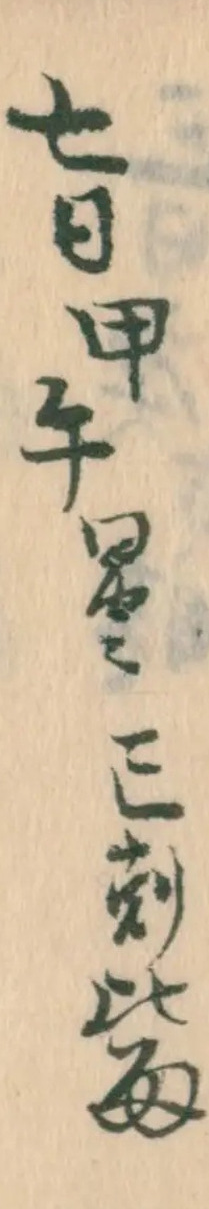七日甲午曇巳刻頃雨
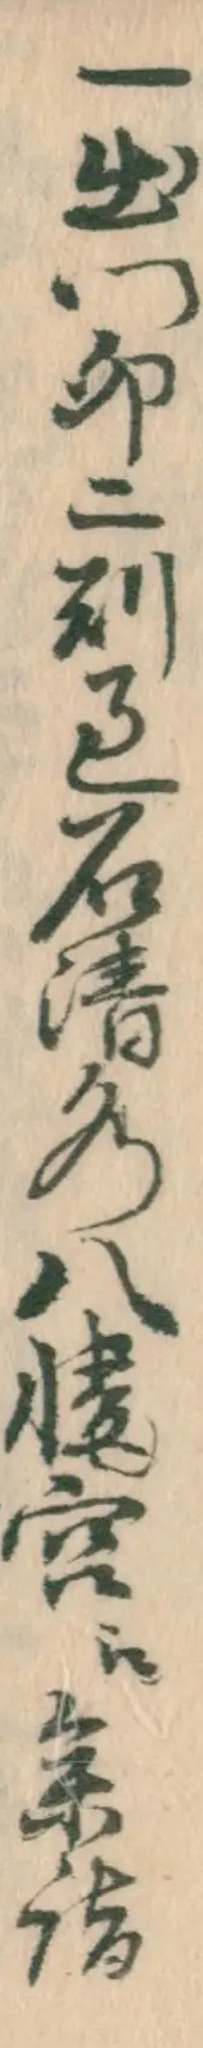一出門卯二刻過石清水八幡宮え参詣
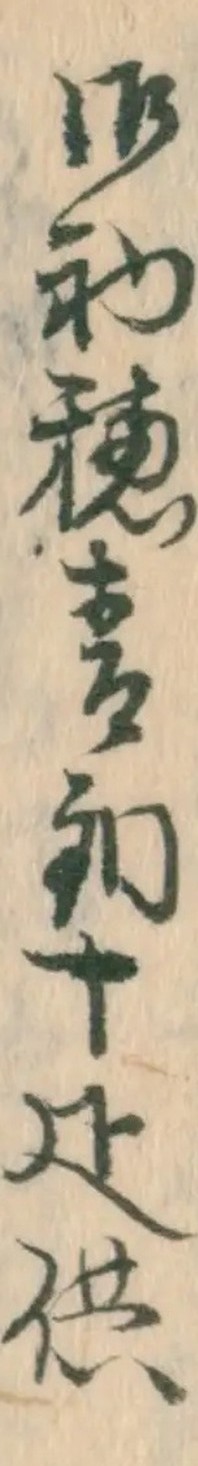御初穂青銅十疋供
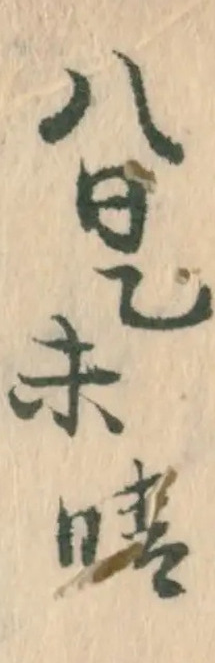八日乙未晴
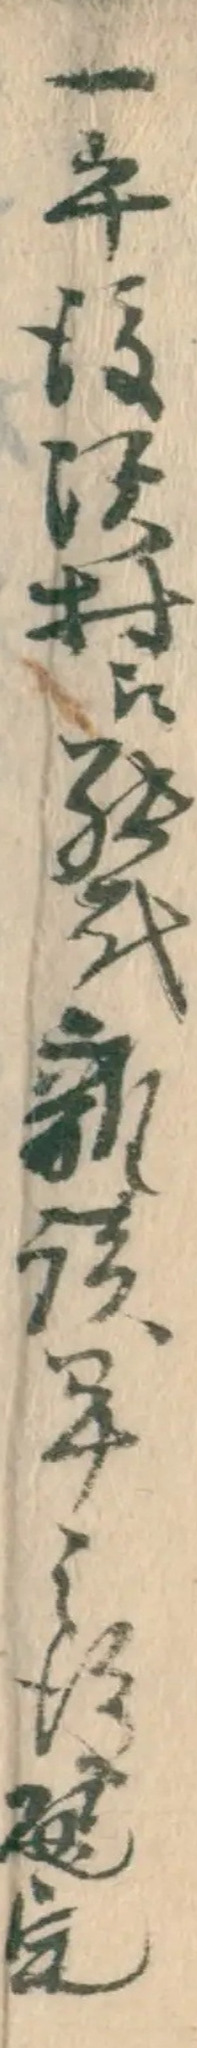一午後沢村え罷越雑談畢之後帰宅

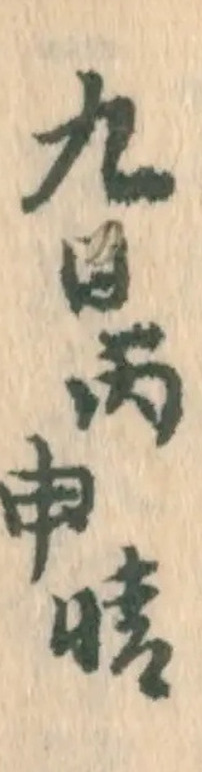九日丙申晴
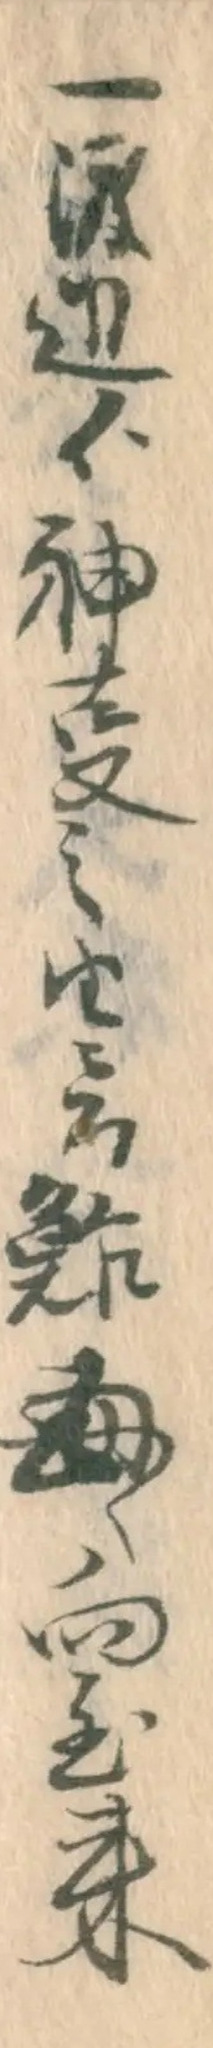一渡辺ゟ神事之由ニ而鮎母へ向到来
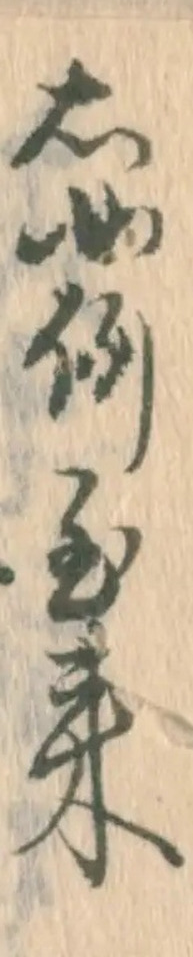右如例到来
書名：禁裏御所御用日記. [131]
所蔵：国立国会図書館 National Diet Library, JAPAN
